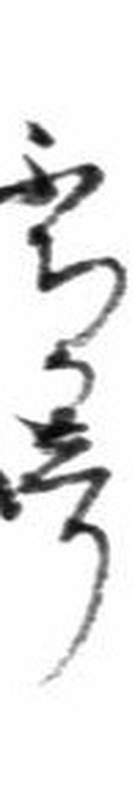ふちかしり
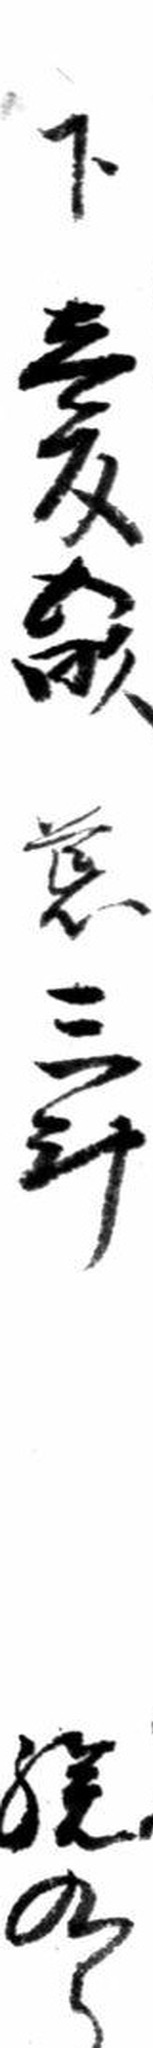下壱反五畝荒三升孫九郎
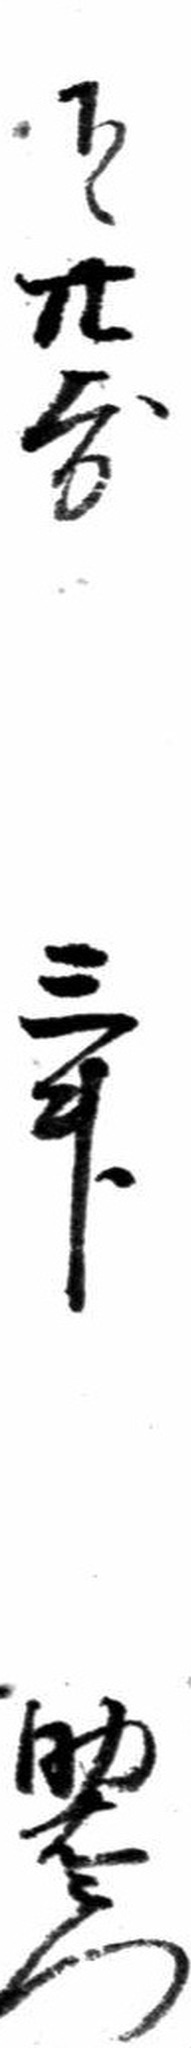下々廿歩三升助右衛門

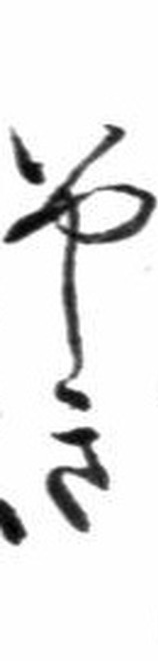いやしき
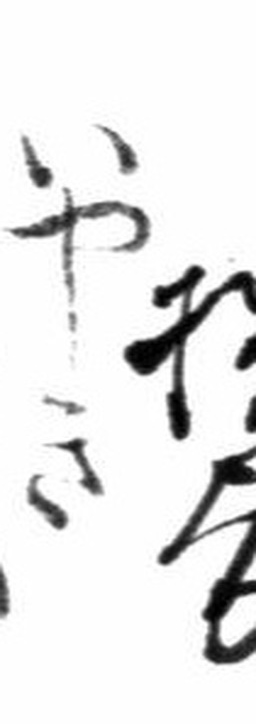いやしき
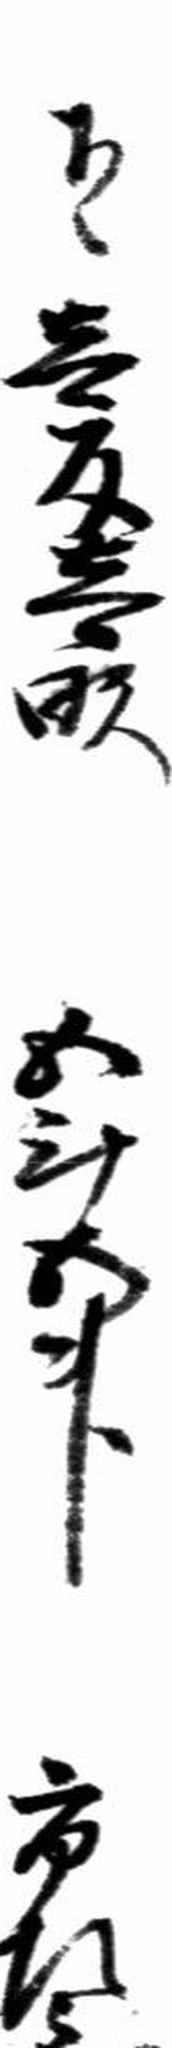下々壱反壱畝五斗五升市左衛門
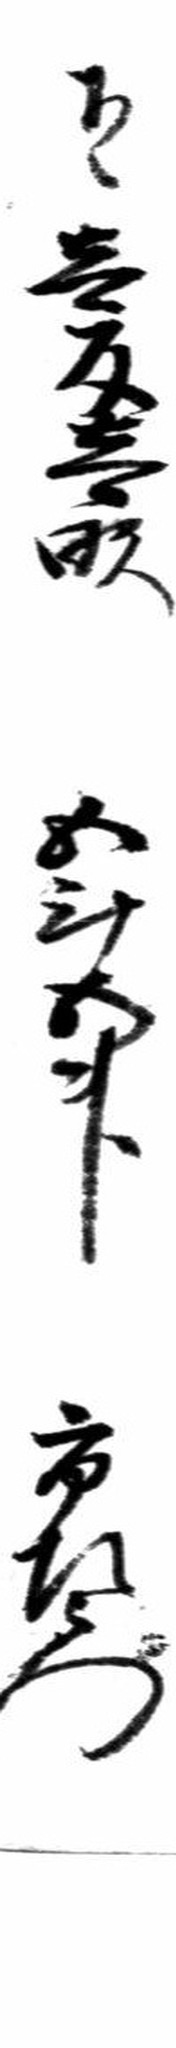下々壱反壱畝五斗五升市左衛門
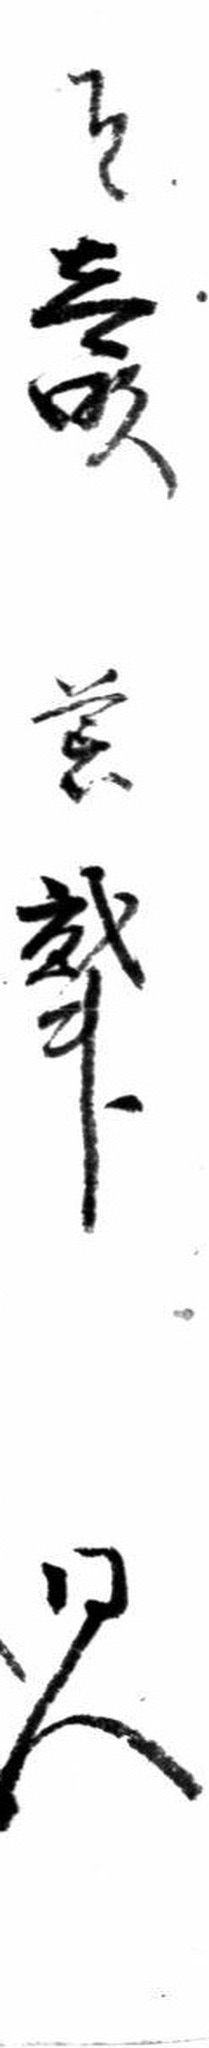下々壱畝荒弐升同人
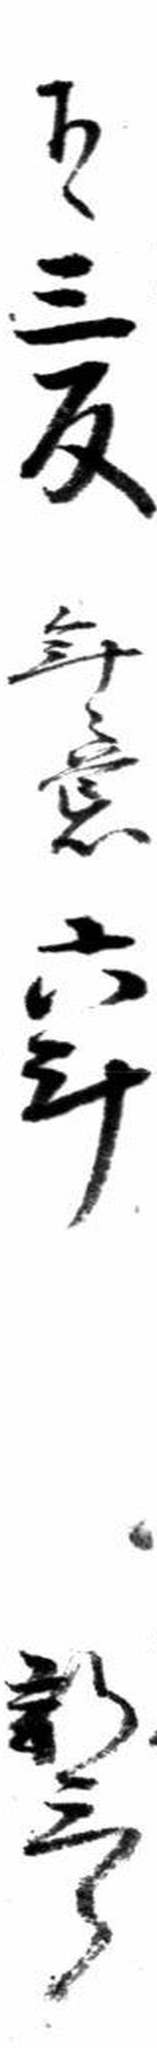下々三反年々荒六斗新三郎
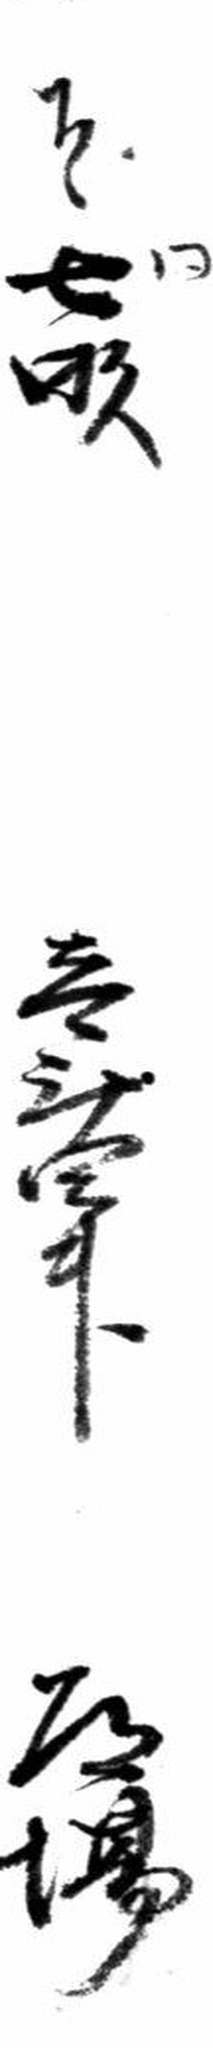下々七畝壱斗四升道場
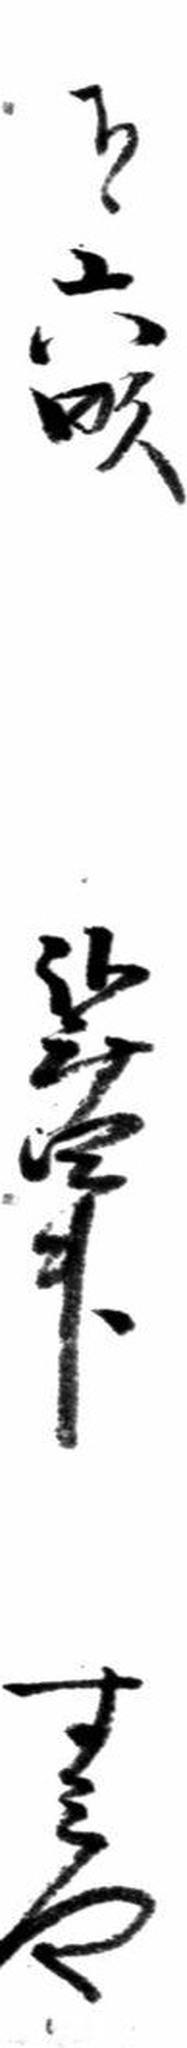下々六畝弐斗四升すみや
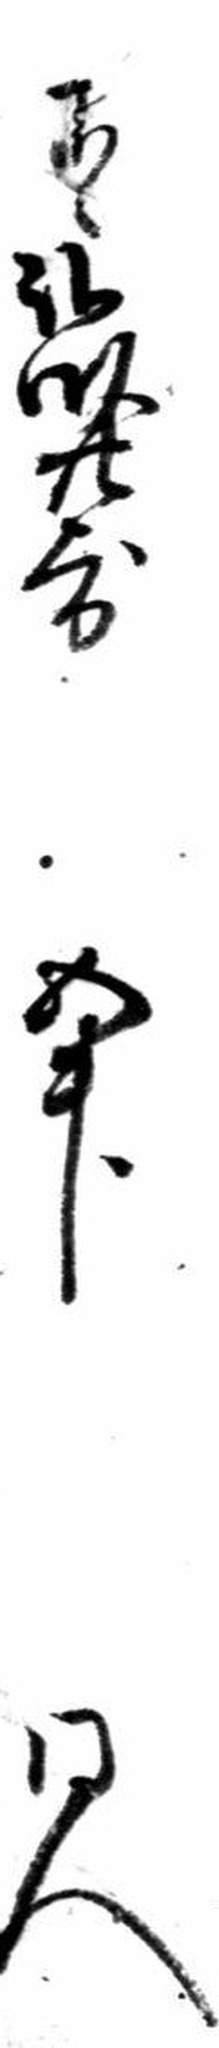下々弐畝廿歩五升同人

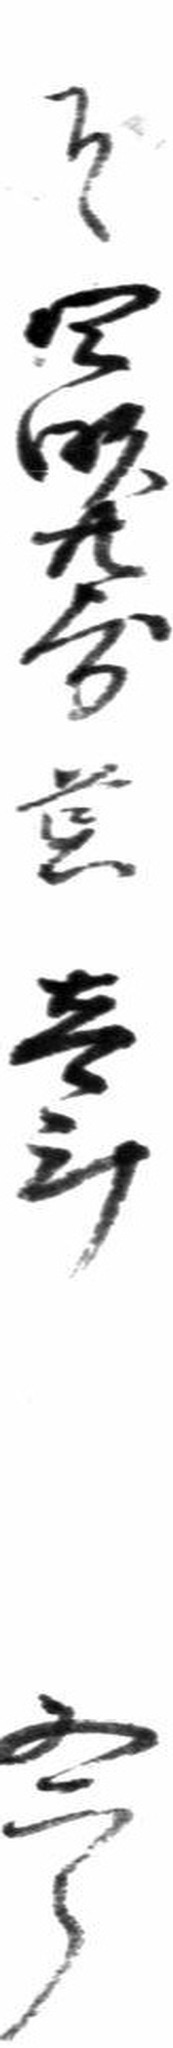下々四畝廿歩荒壱斗又二郎
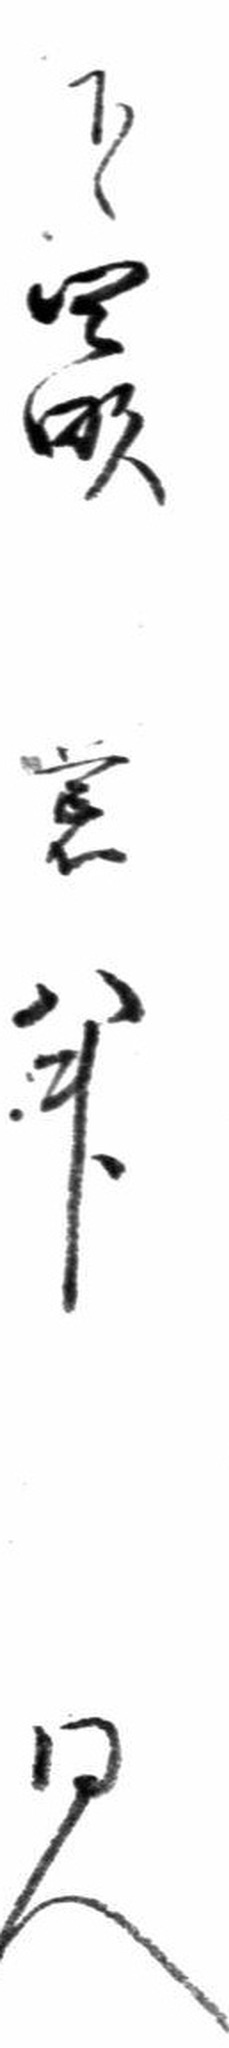下々四畝荒八升同人
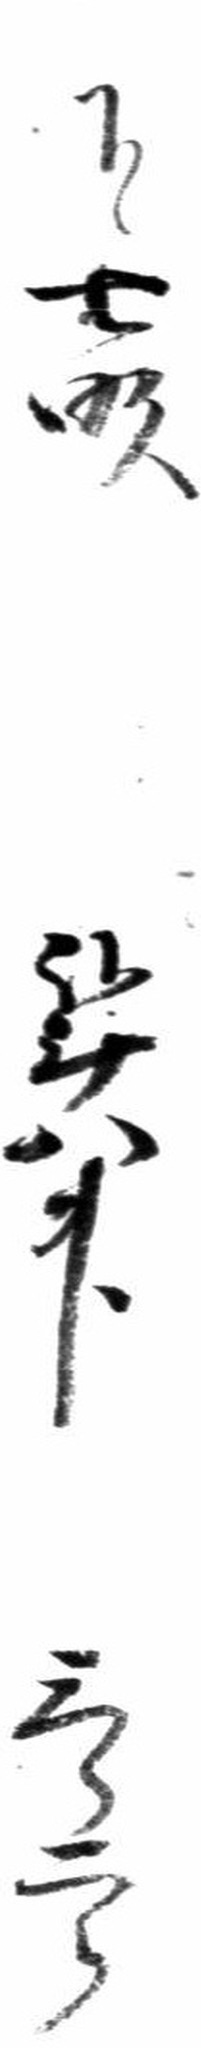下々七畝弐斗八升三郎二郎
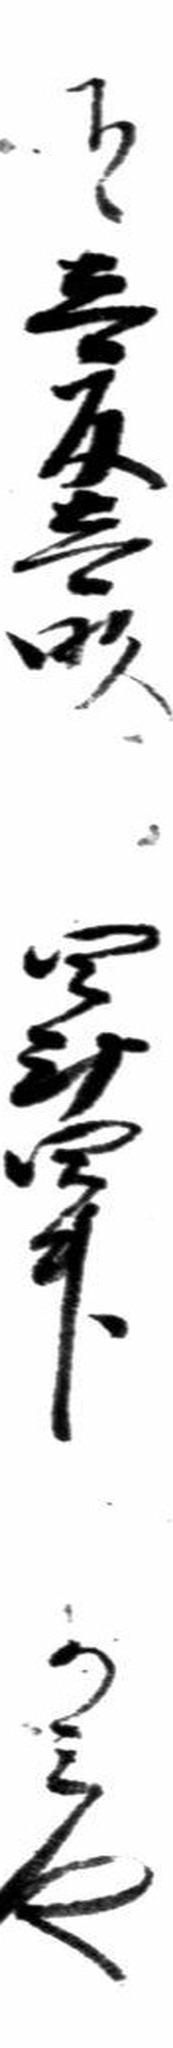下々壱反壱畝四斗四升かみや
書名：若州三方郡之内世久見浦御検地帳（世久見浦検地帳写）
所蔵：福井県文書館 Fukui Prefectural Archives
